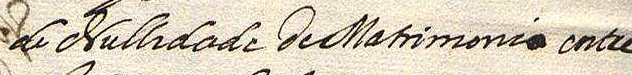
de Nullidade de Matrimonio entre
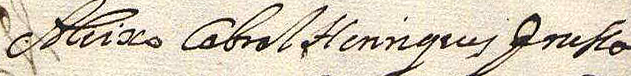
Aleixo Cabral Henriques q̄ nessa
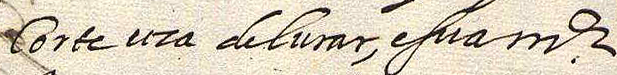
Corte uza de Curar, e sua mer.
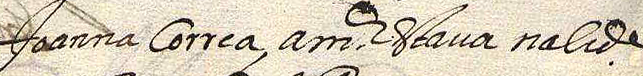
Joanna Correa, a m.er estaua na Cid.e
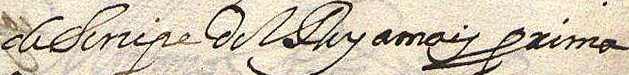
de Seriipe del Rey a mais ꝓxima
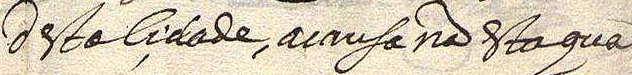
desta Çidade, a causa naõ esta qua
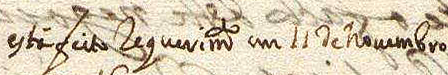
está feito Requerimto em 11 de Nouembro
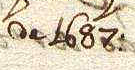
de 1687:
